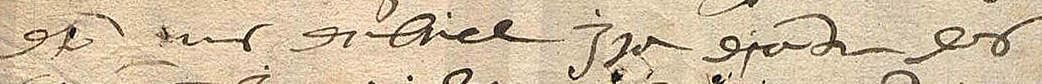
dt̄o mes dabrill Jra djāte dos
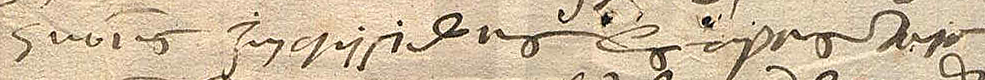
Snōres Jmqujsidores e se apresētara
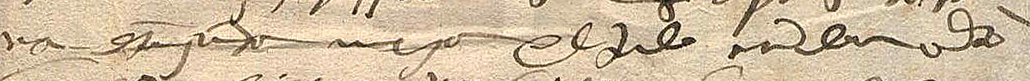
na dt̄a sāta mesa e de tudo mādou o dtō
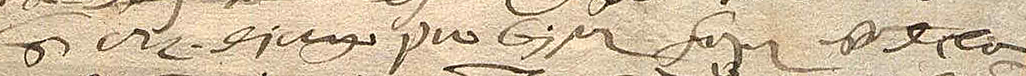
s̄r arcedjago provjsor fazer esta decla
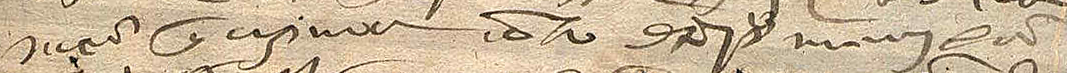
raçaõ q̄ asinou c̄o ho dt̄o po nunez e cō
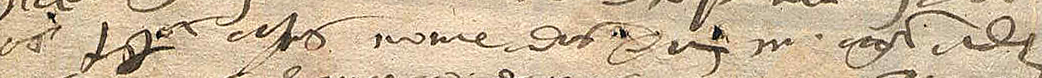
as testas atras nomeadas em m agão a dez
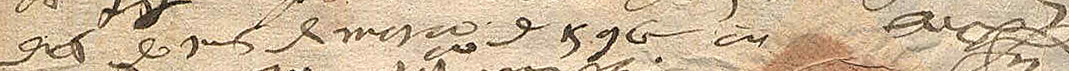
dias do mes de março de 1596 eu lchior frz̄
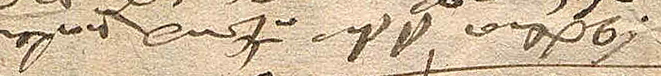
espuaõ e notro appco o espvj
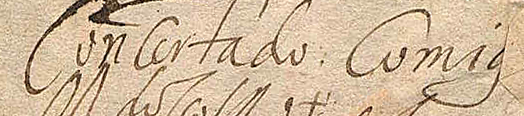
Concertado Comig
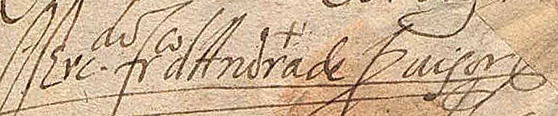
O Arc.do frco dAndrade Ꝓuisor
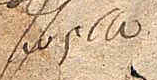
ao sello
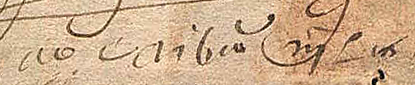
ao escrivaõ iijc L rs
